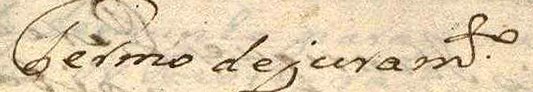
Termo de juram.to
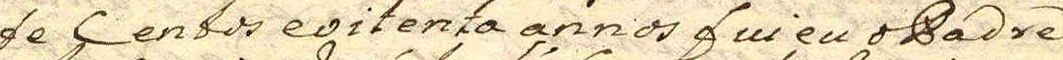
teCentos e oitenta annos fui eu o Padre
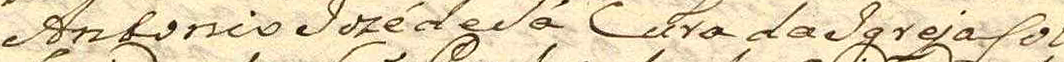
Antonio Iozé de Sá Cura da Igreja Col
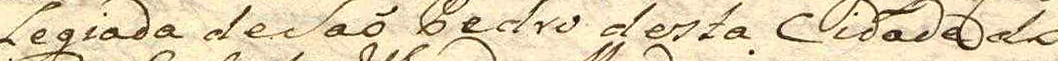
Legiada de Saõ Pedro desta Cidade do
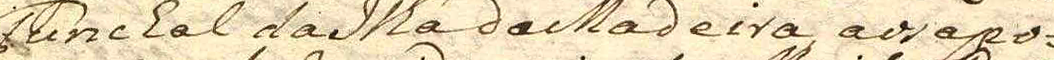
Funchal da Ilha da Madeira aos apo
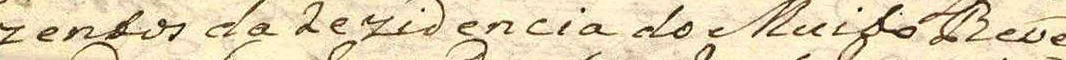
zentos da Rezidencia do Muito Reve
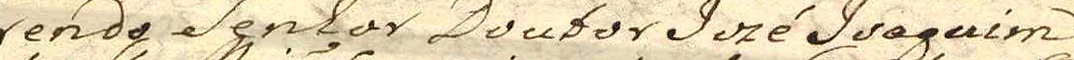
rendo Senhor Doutor Iozé Ioaquim
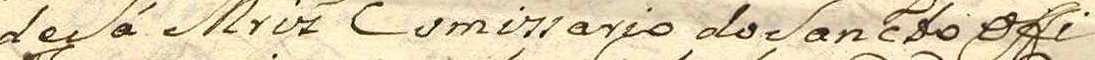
de Sá Mriz̄ Comissario do Sancto Offi
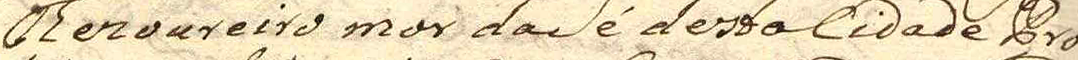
Thezoureiro mor da Sé desta Cidade Pro
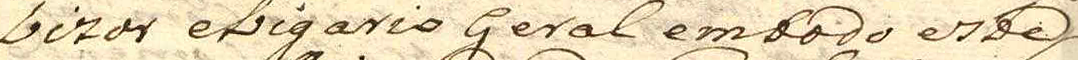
Vizor e Vigario Geral em todo este
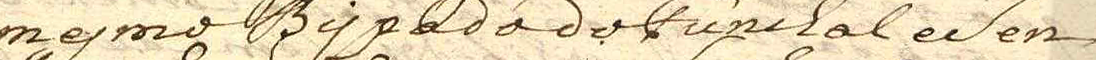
mesmo Bispado do Funchal e Sen
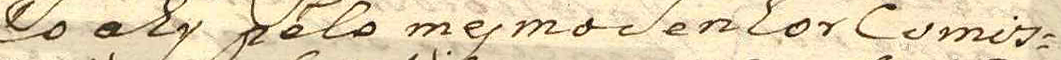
do ahy pelo mesmo Senhor Comis
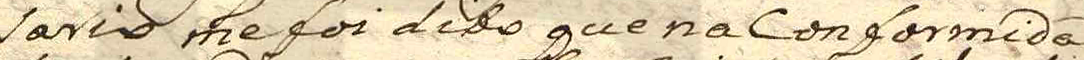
sario me foi dito que na Conformida
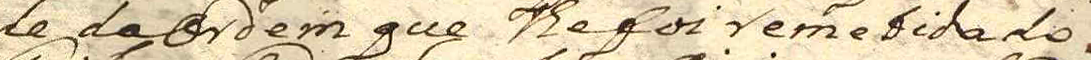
de da Ordem que lhe foi remetida do
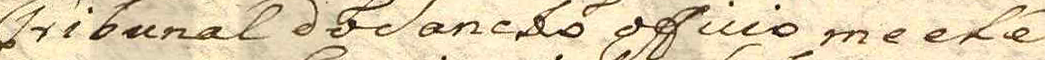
Tribunal do Sancto officio me eLe
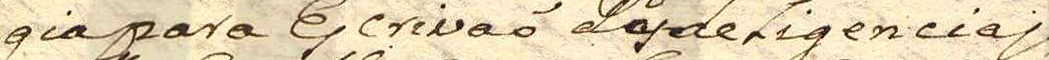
gia para Escrivaõ das deLigencias
